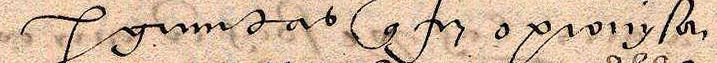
ꝑgumtas q̄ fez o prouysor
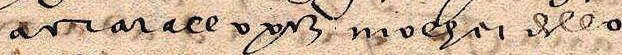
a crara llopez molher de llo
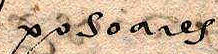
po soares
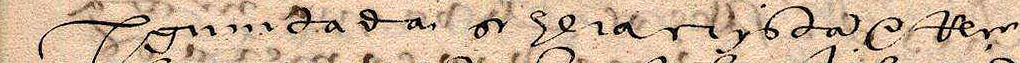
ꝑgumtada se hera crystā e Reçe
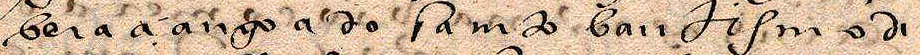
bera a augoa do samto bautismo di
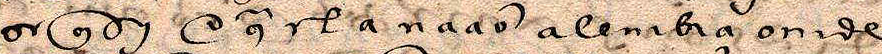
se q̄ sy e q̄ ela naaõ alembra omde
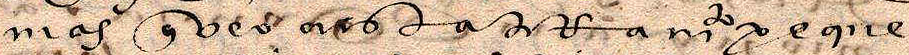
mas q̄ veo a esta teRa mto peque
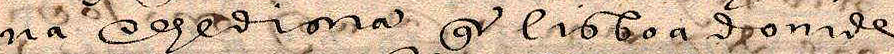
na e lhe diserā q̄ ē lisboa domde
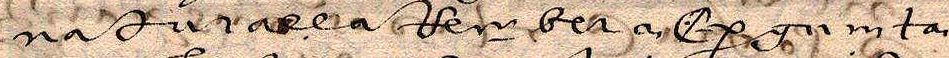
naturall a Reçebera E ꝑgumta
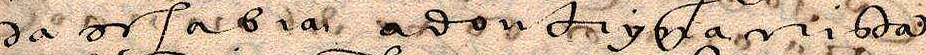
da se sabia a doutryna cristā
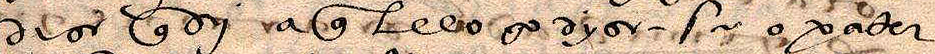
dise q̄ sy a q̄l llogo dyse -s- o pater
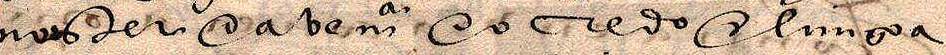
noster e ave ma e o Credo ē limgoa
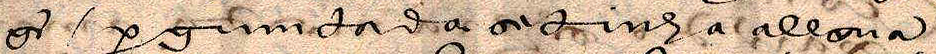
gē / ꝑgumtada se tinha allguā
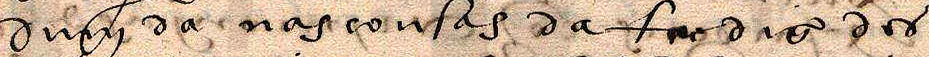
duujda nas cousas da fee digo dos
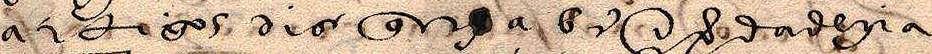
artigos dise q̄ crja bē e ꝟdadeyra
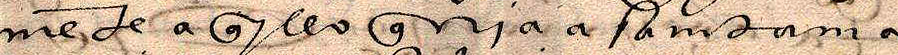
mēte aq̄jllo q̄ crja a samta ma
